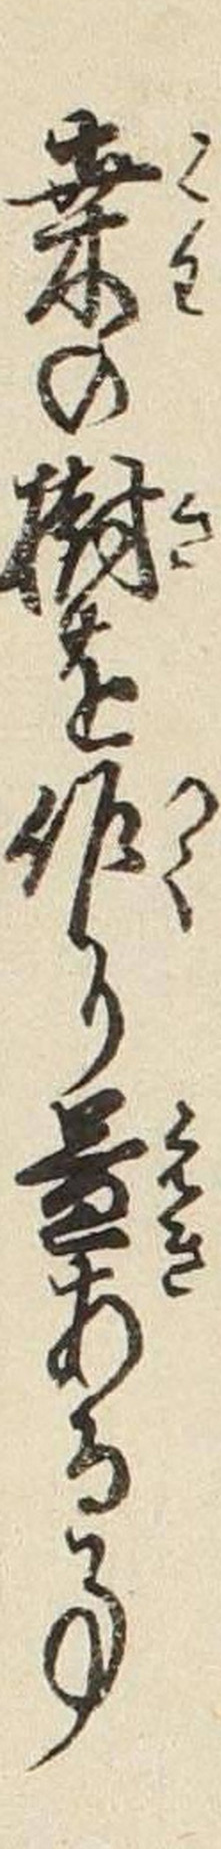桑の樹を作り益ある事
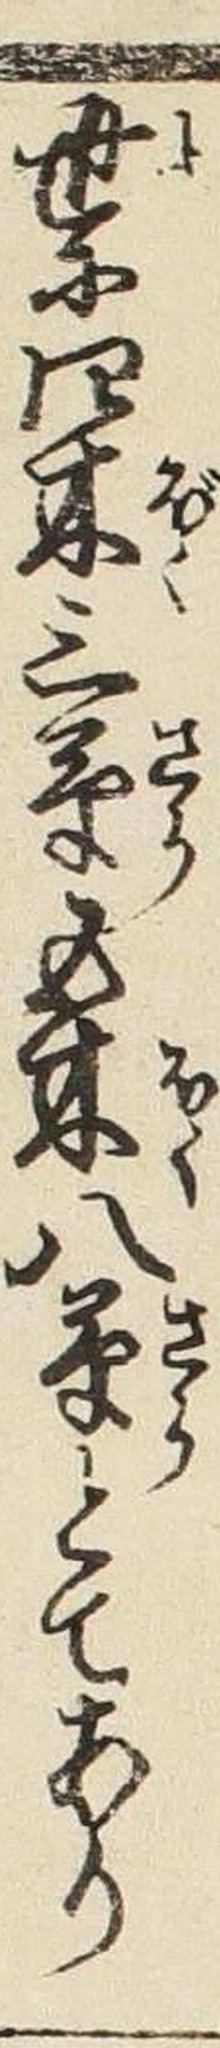世に四木三草五木八草とてあり
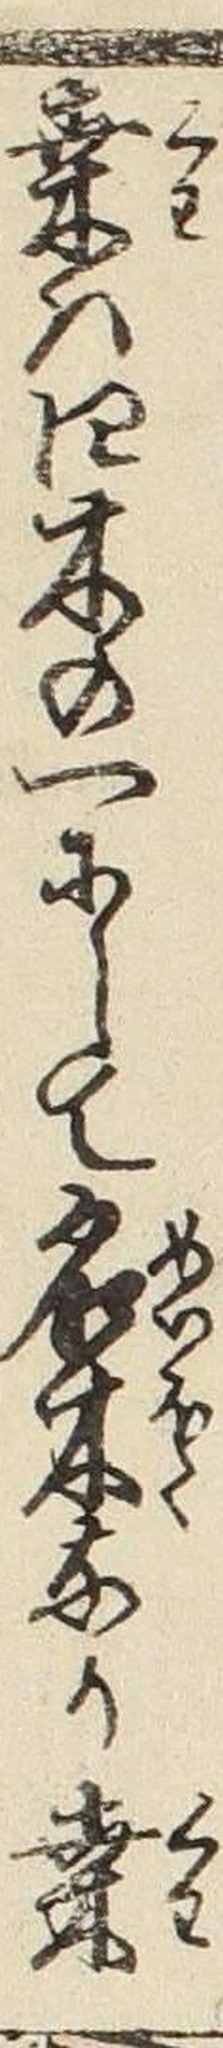桑は四木の一にして名木なり桑
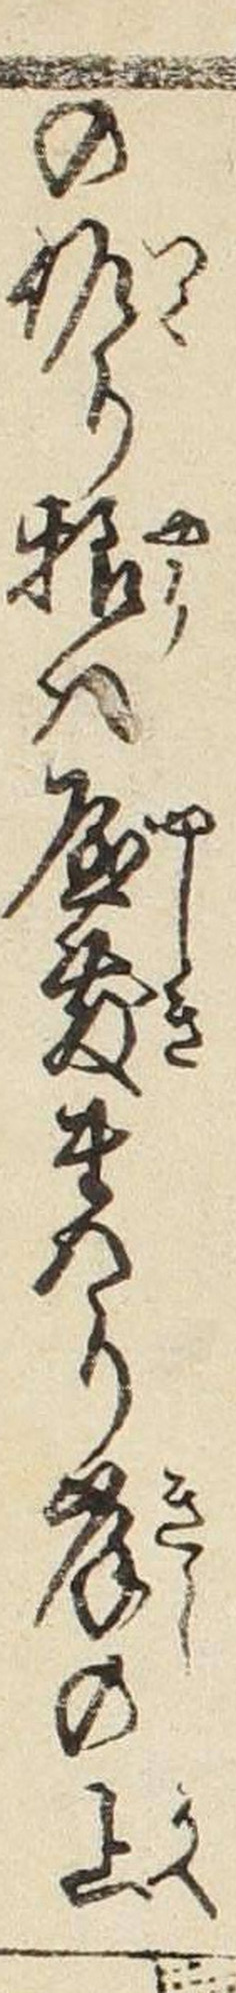の作り様は屋敷まはり岸の上

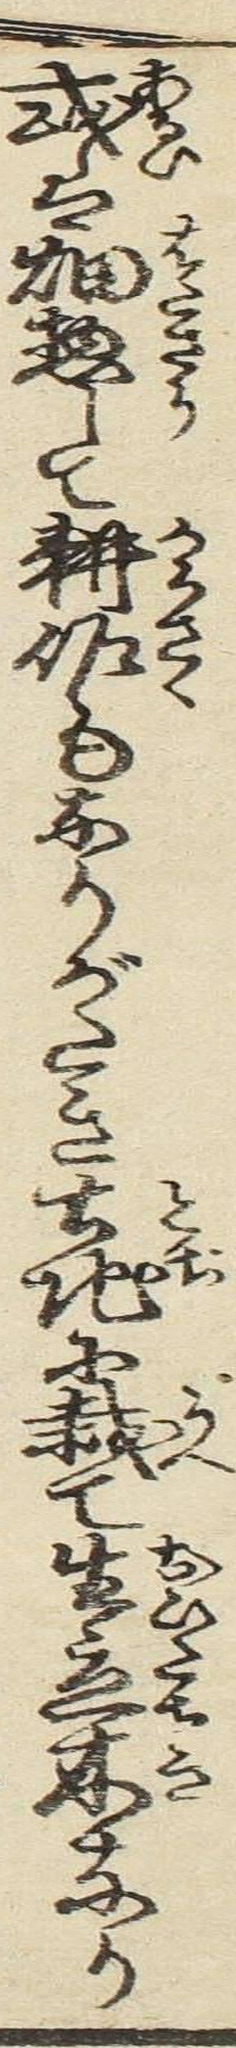或は畑惣して耕作もなりがたき土地に栽て生立木なり
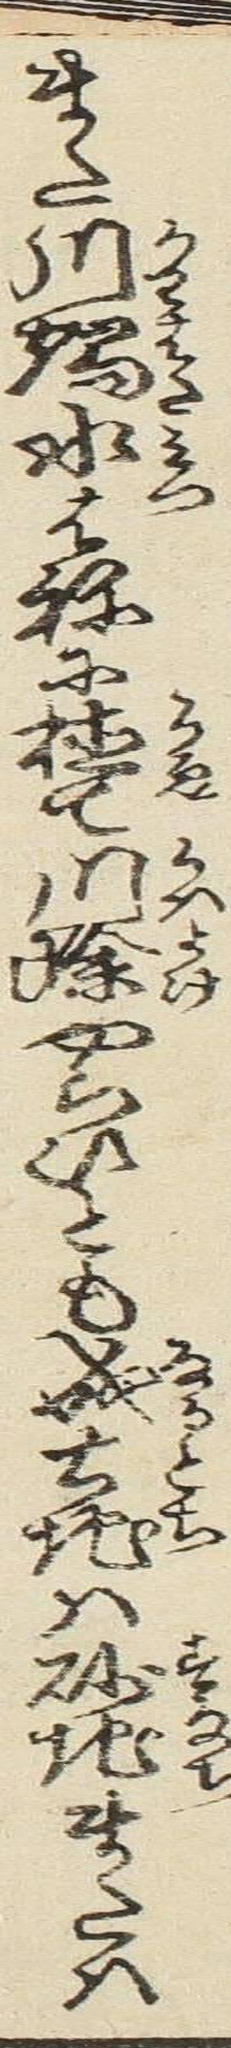また川端水はねに植て川除やらひとも成土地は砂地または
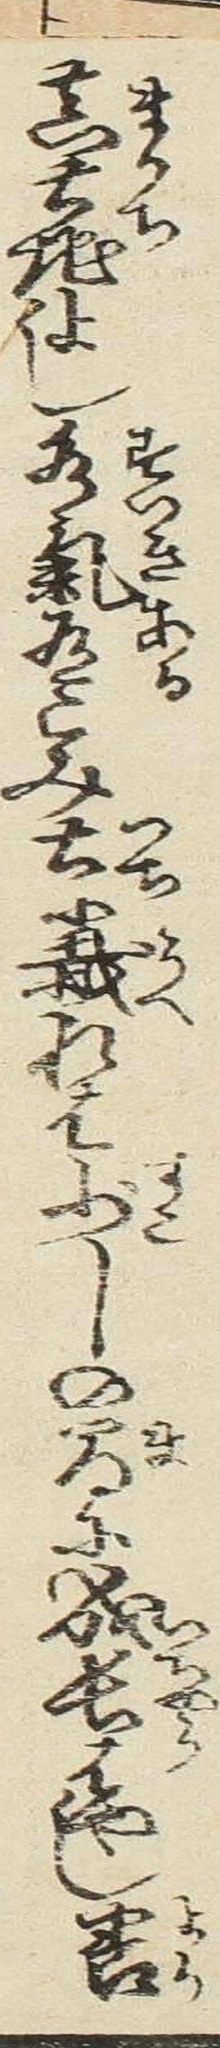真土地よし水気有み土に栽れは少しの間に成長はやし養
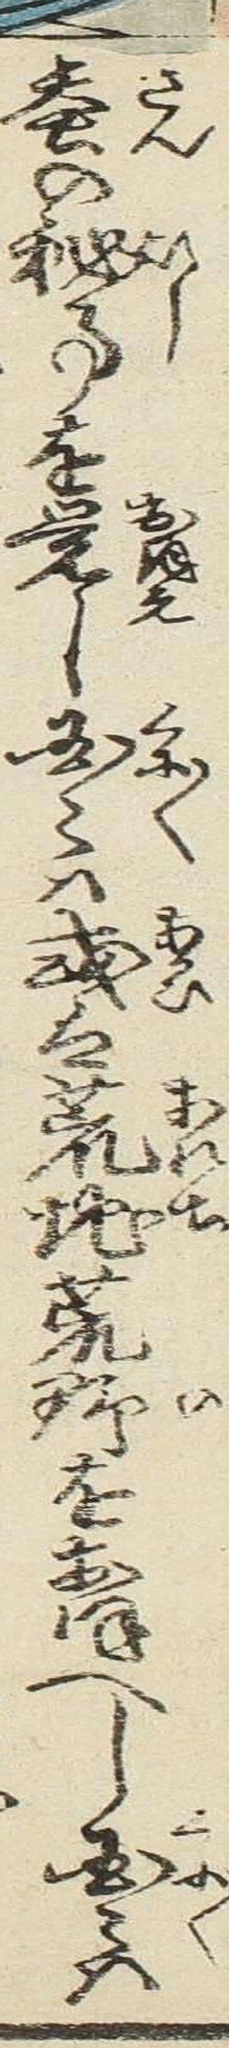蚕の秘事を覚し国々は或は荒地荒野をおほへし国々は
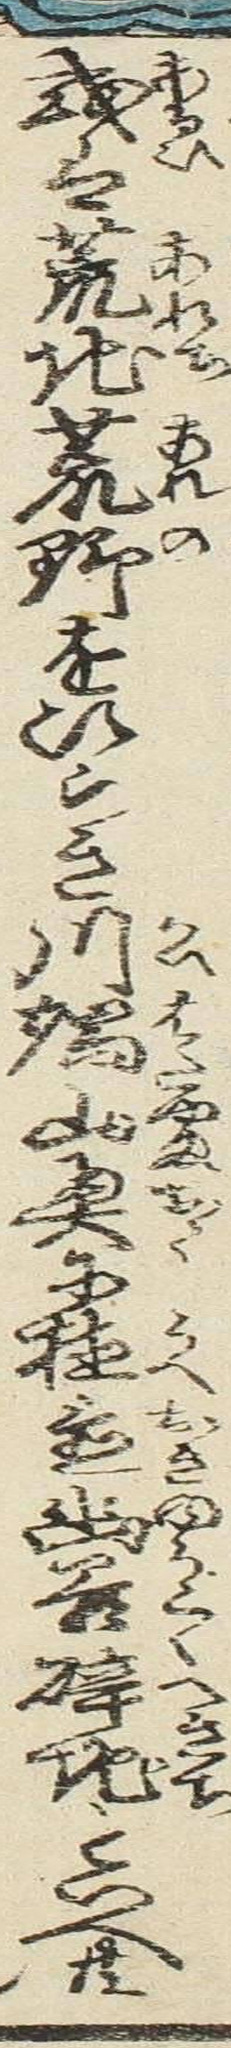或は荒地荒野をひらき川端山奥に植置幽谷僻地といへ共
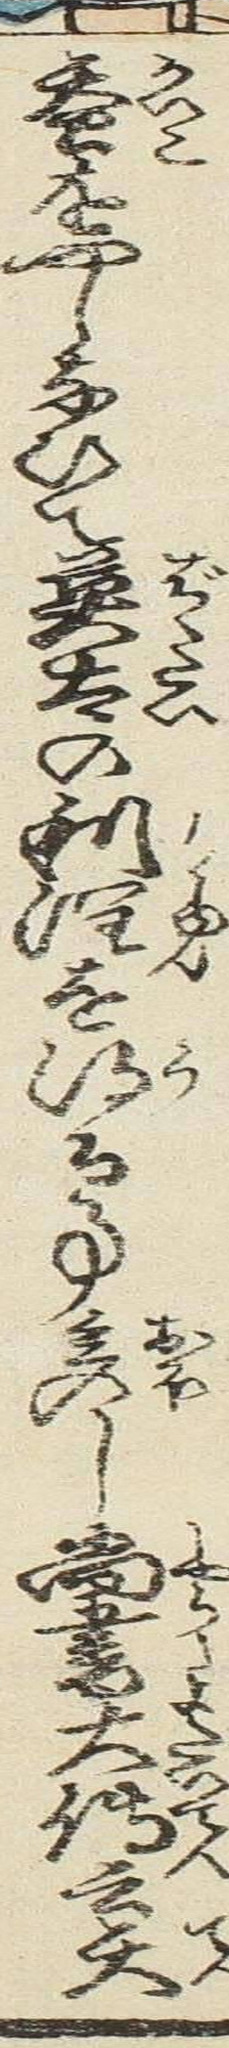蚕をやしなひて莫大の利潤を得る事多し尚書大伝云天
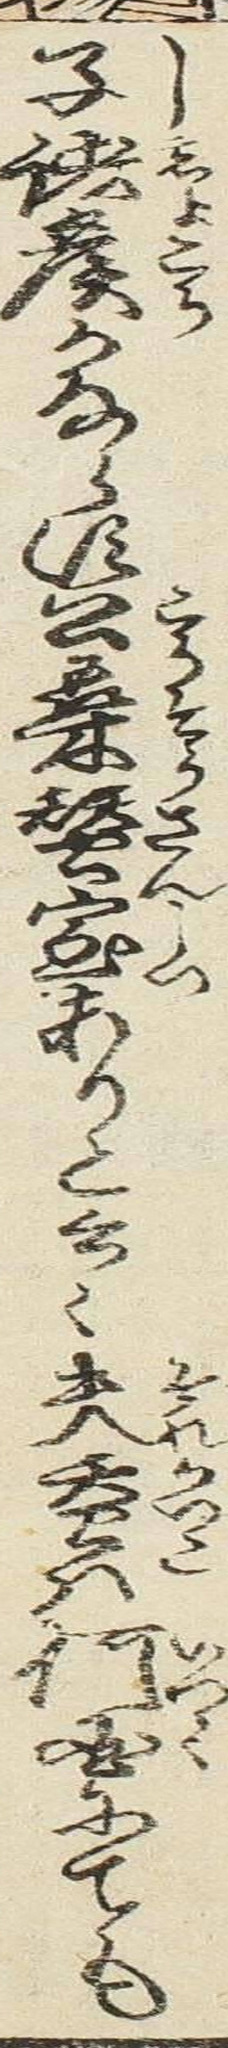子諸侯かならす公桑蚕室ありと云々夫蚕は何国にても
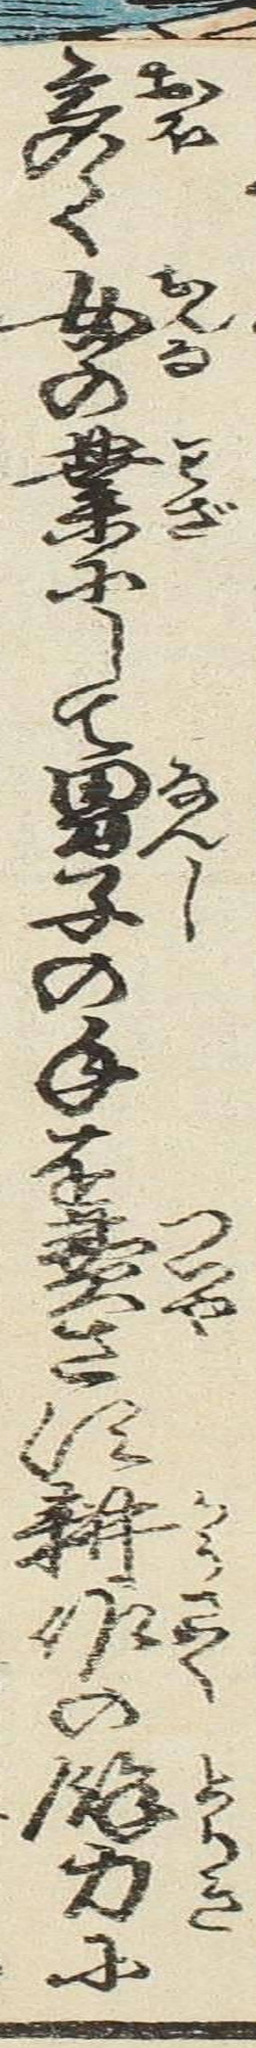多く女の業にして男子の手を費さす耕作の余力に
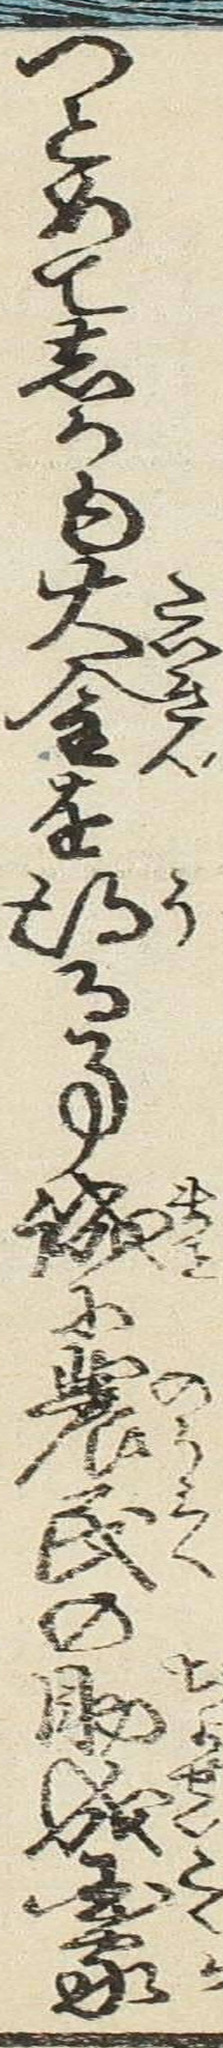つとめてしかも大金を得る事誠に農民の助成国家
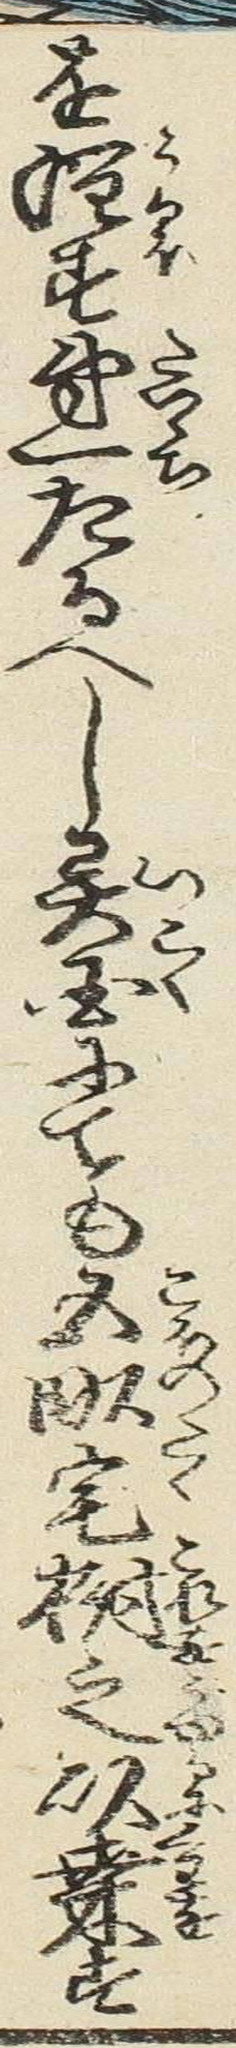を潤す第一たるへし異国にても五畝宅樹之以桑す
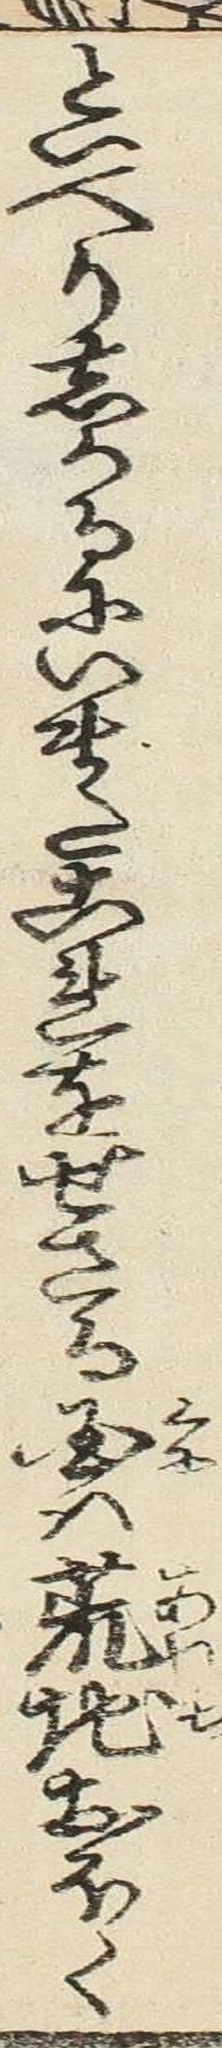といへりしかるにいまたこれをせさる国は荒地おほく
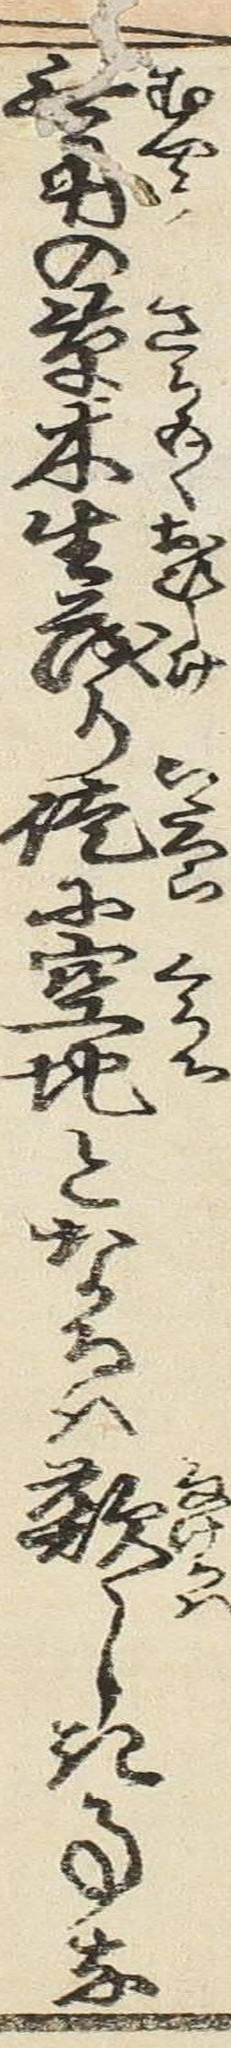無用の草木生茂り徒に空地となるは歎しき事な
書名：養蠶圖解
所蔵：東京大学農学生命科学図書館 国文学研究資料館
